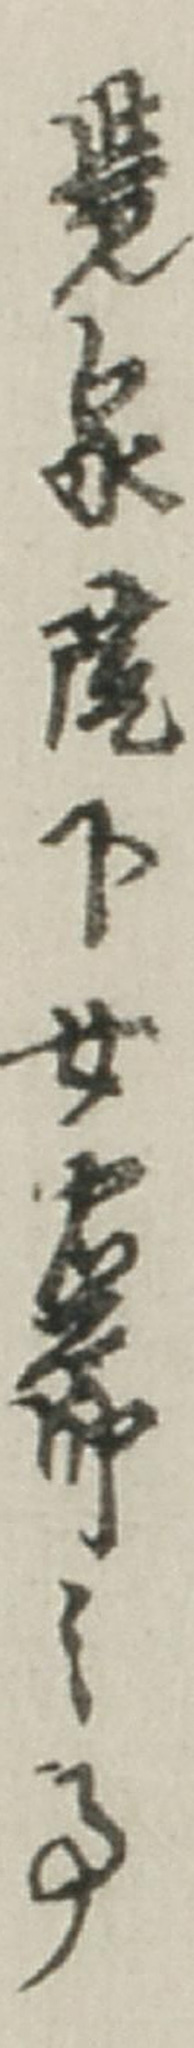覚泉院下女忠節之事
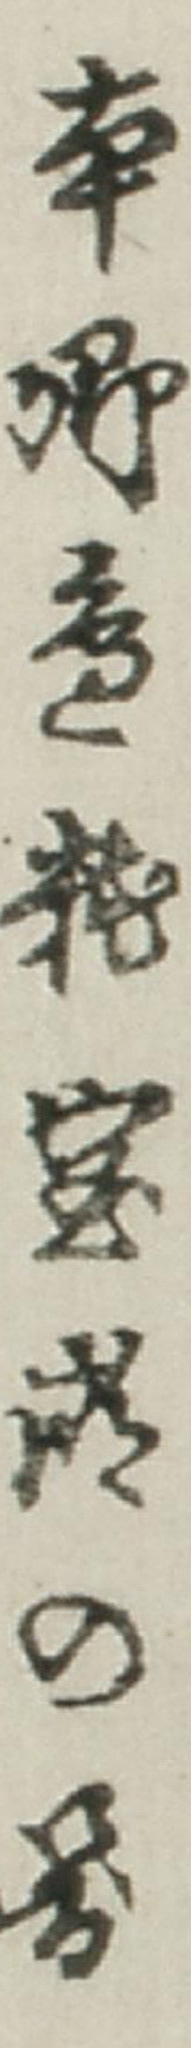本郷辺糀室崩の図
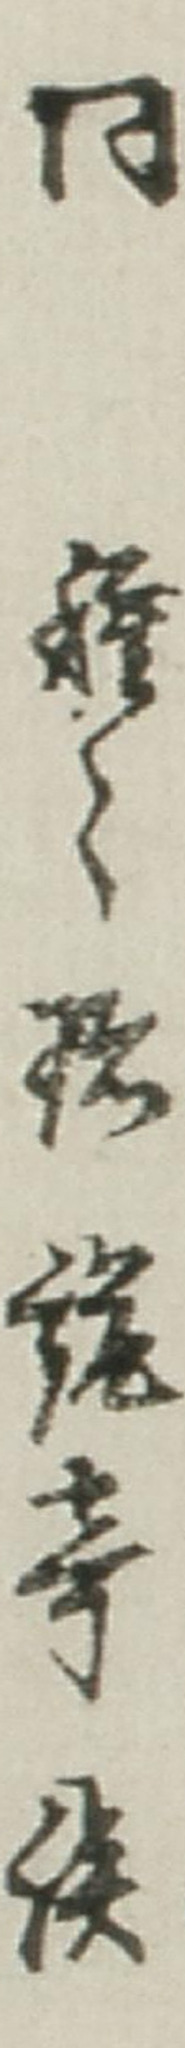同種々珍説奇談
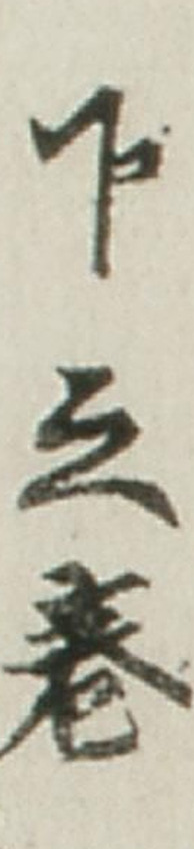下之巻
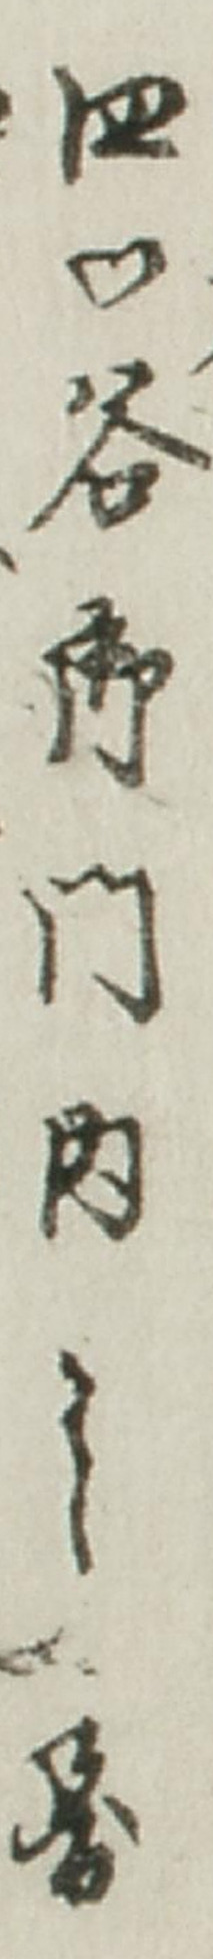四ッ谷御門内之図
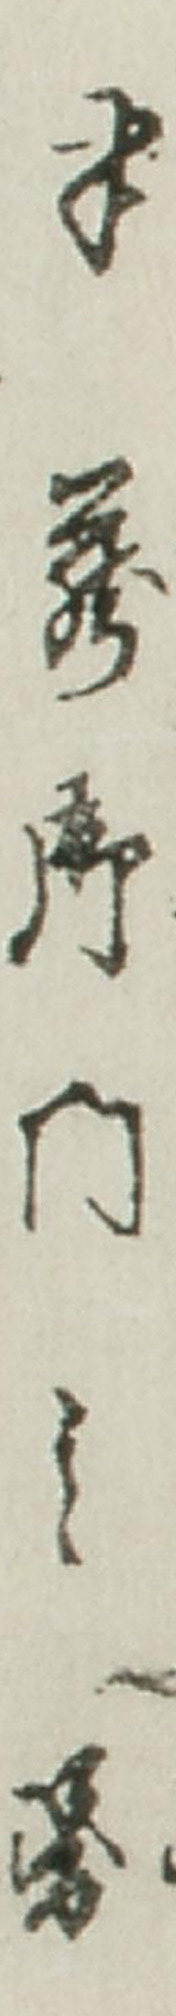半御蔵門之図
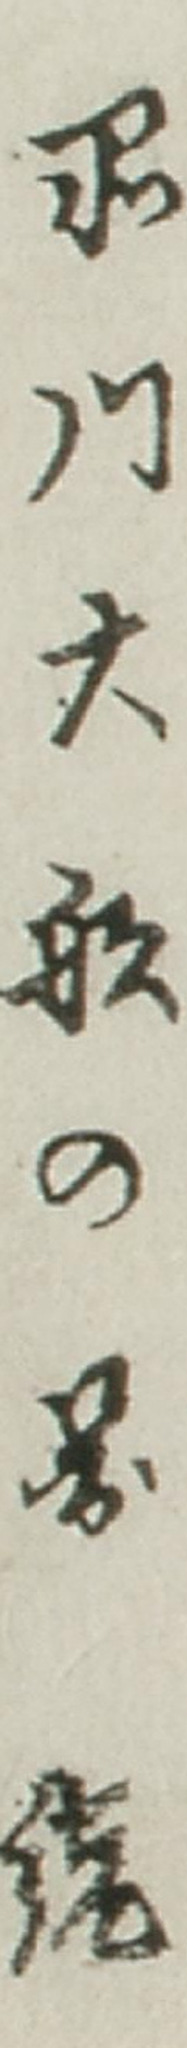品川大船の図説
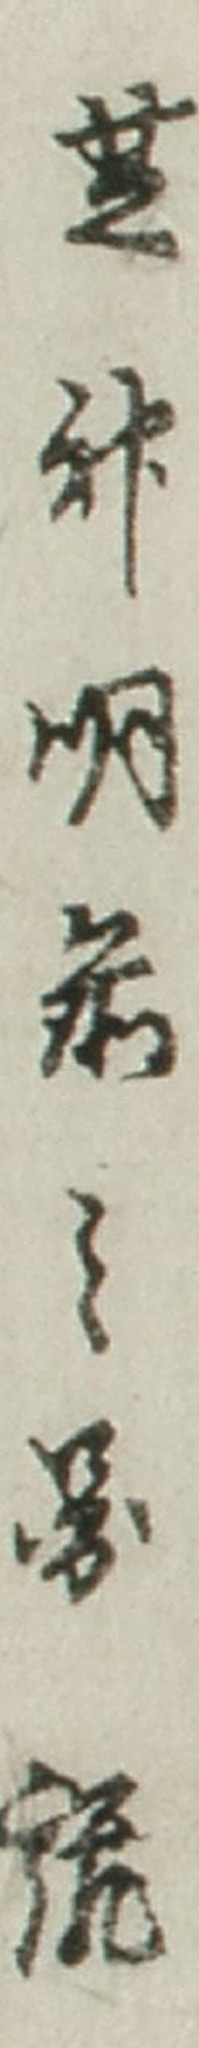芝神明前之図説

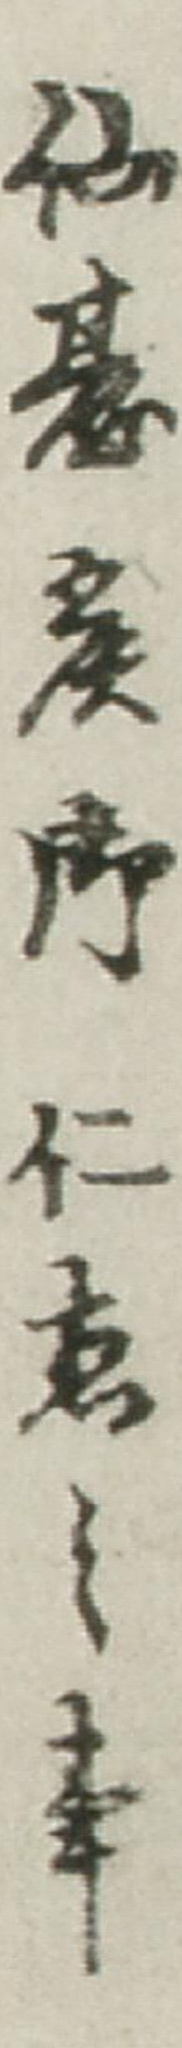仙台矦御仁恵の事
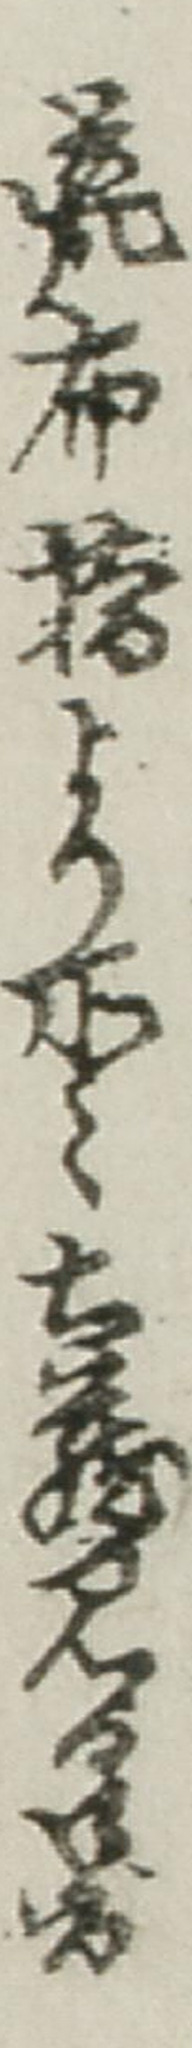荒布橋より所〻土蔵見る図
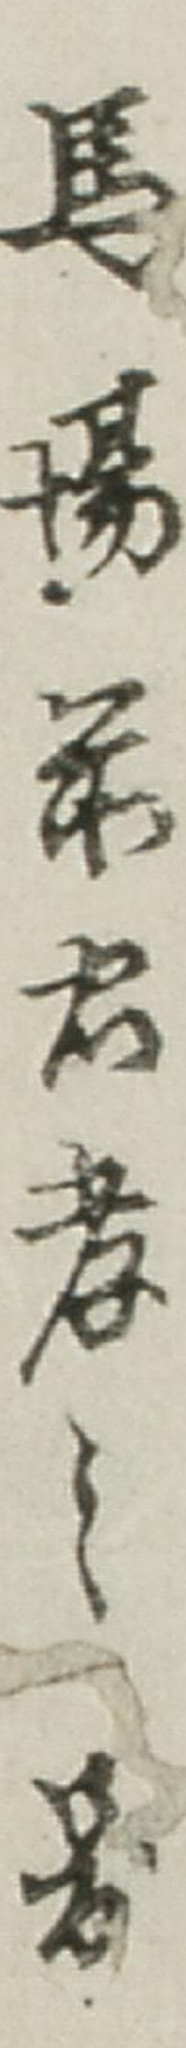馬場前忠孝之図
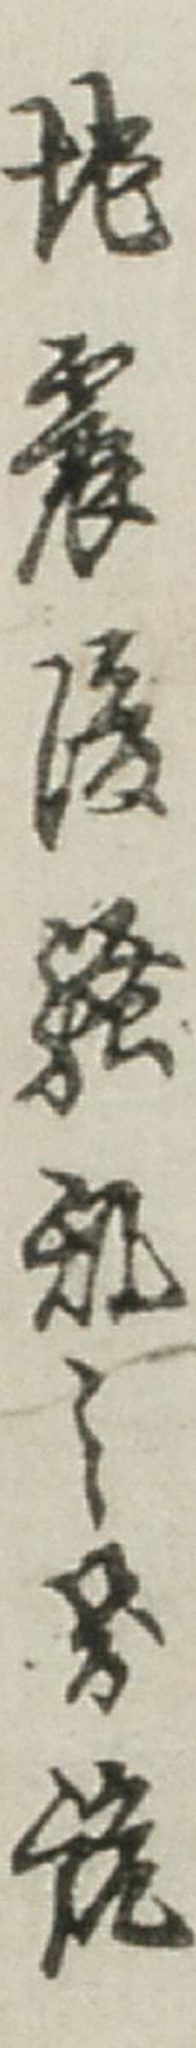地震後騒乱之図説
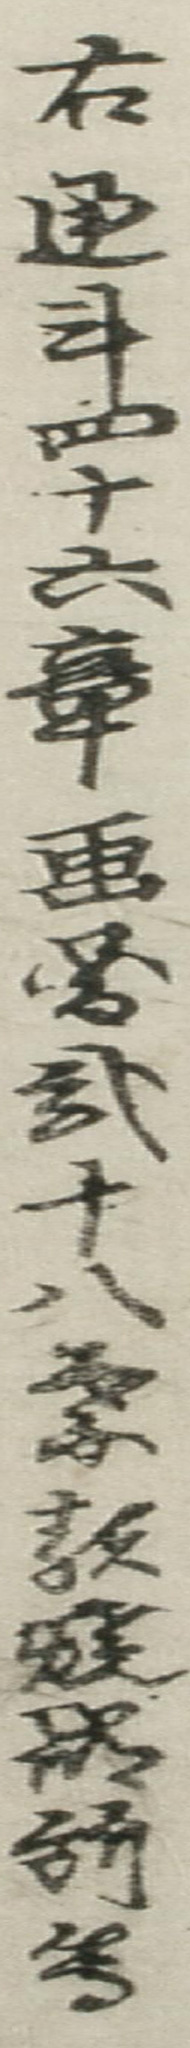右通計四十六章画図弐十八葉類焼崩所等
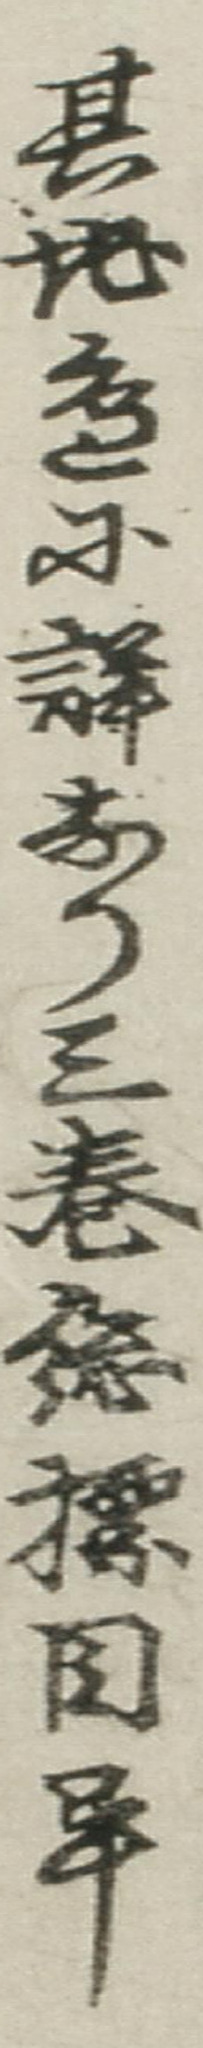其地辺不詳なり三巻総標目畢
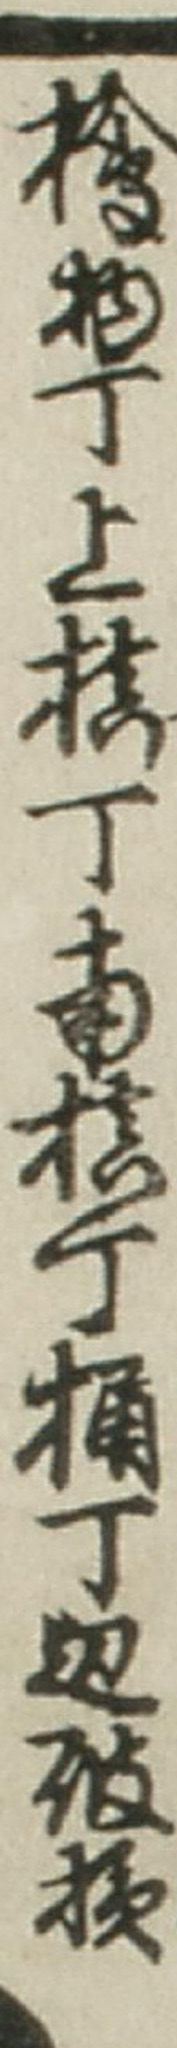檜物丁上槙丁南槙丁桶丁辺破損
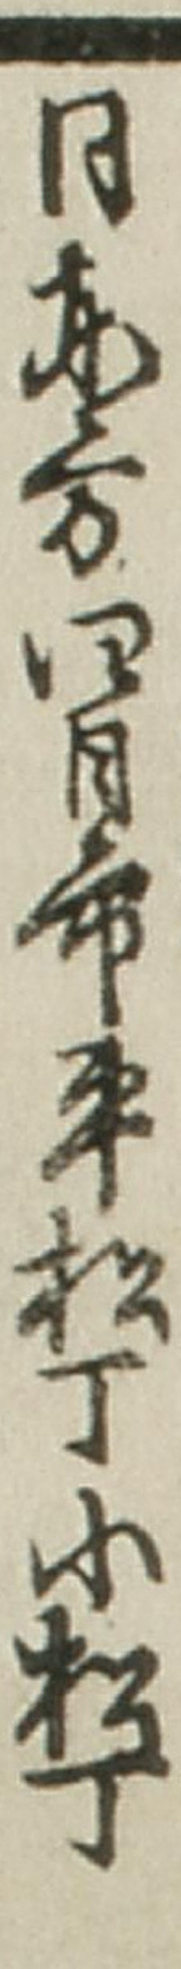同東方四日市平松丁小松丁
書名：安政見聞誌　上
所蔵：東京大学地震研究所図書室 Earthquake Research Institute Library, The University of Tokyo, JAPAN
